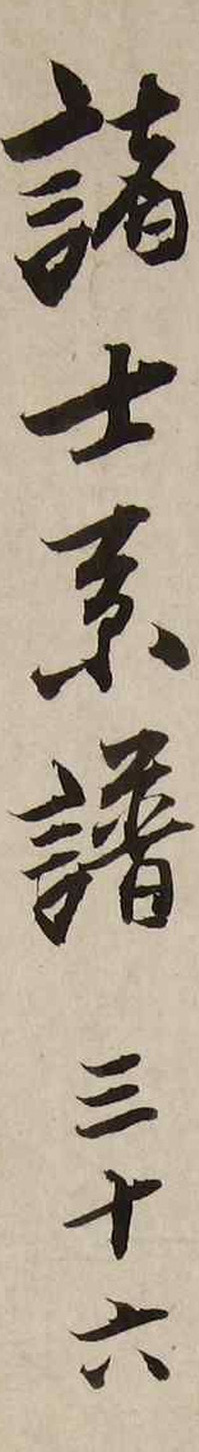諸士系譜三十六

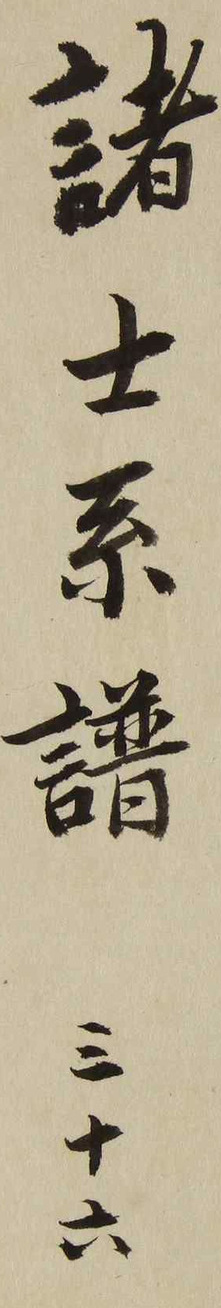諸士系譜三十六

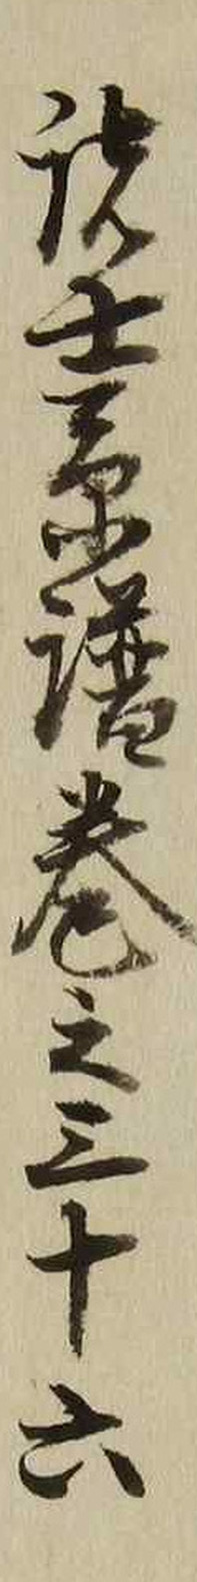諸士系譜巻之三十六
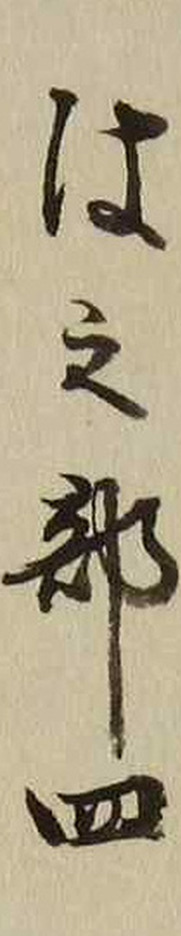は之部四
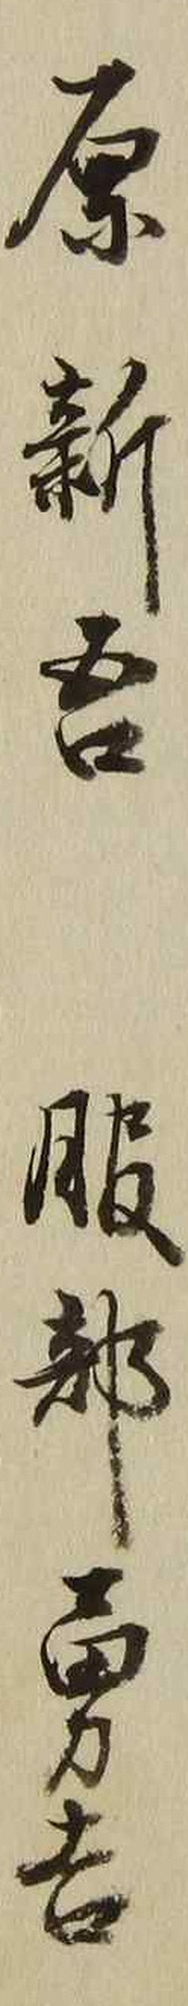原新吾服部勇吉
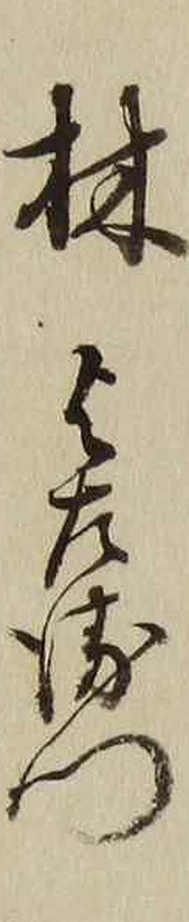林与左衛門

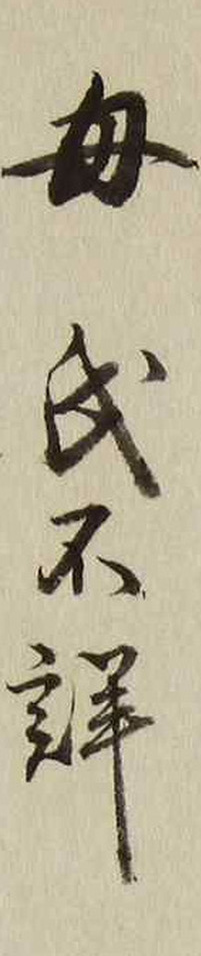母氏不詳
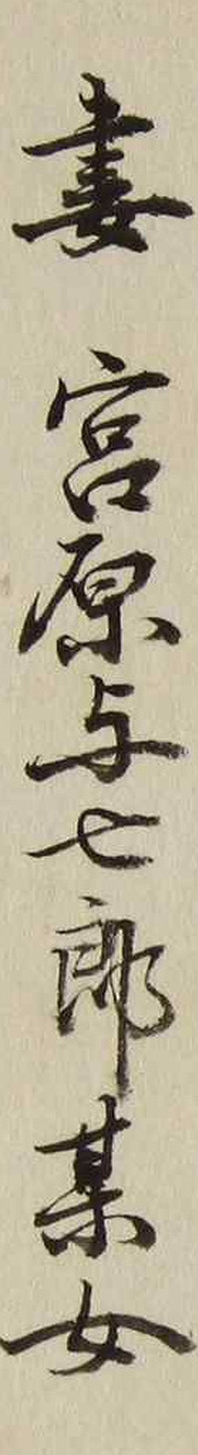妻宮原与七郎某女
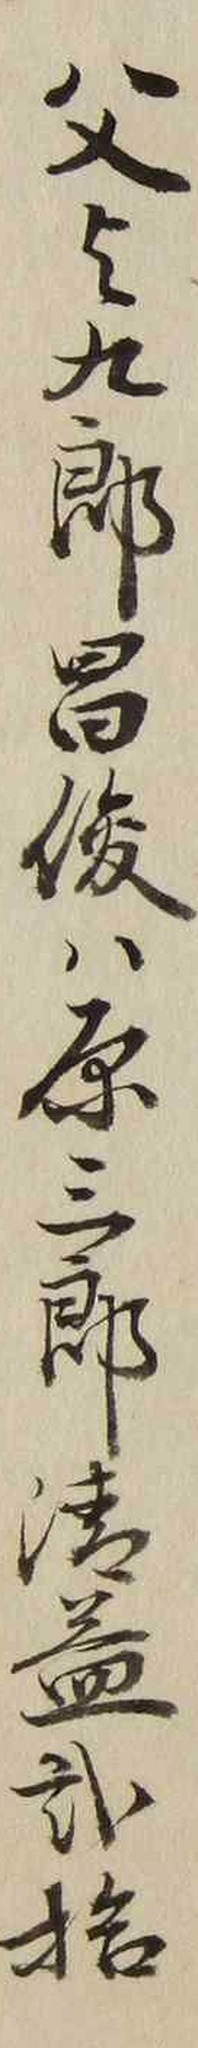父与九郎昌俊ハ原三郎清益弐拾

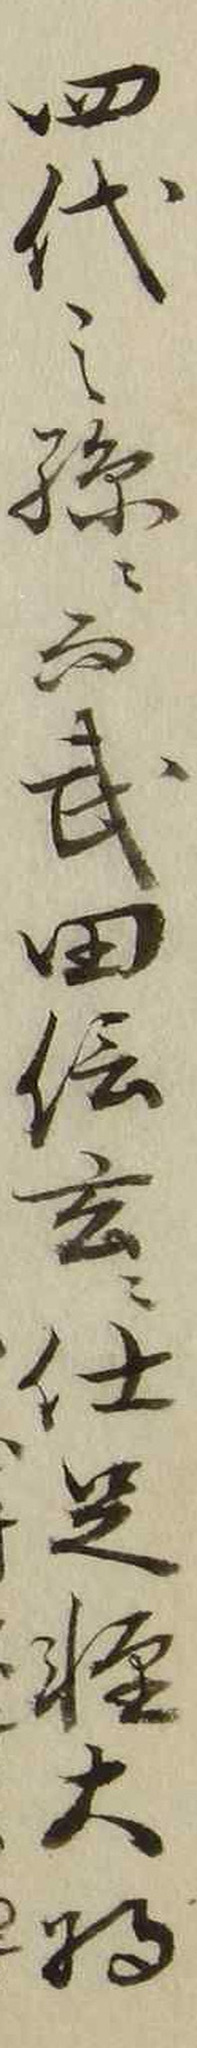四代之孫ニ而武田信玄ニ仕足軽大将
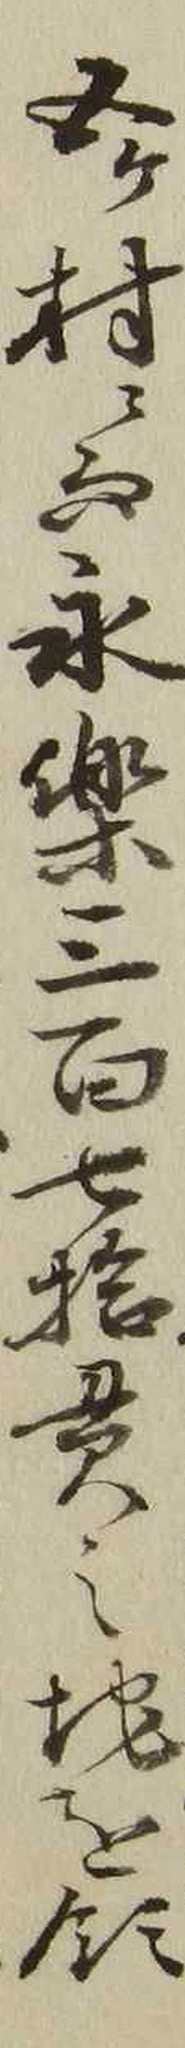五ヶ村ニ而永楽三百七拾貫之地を領
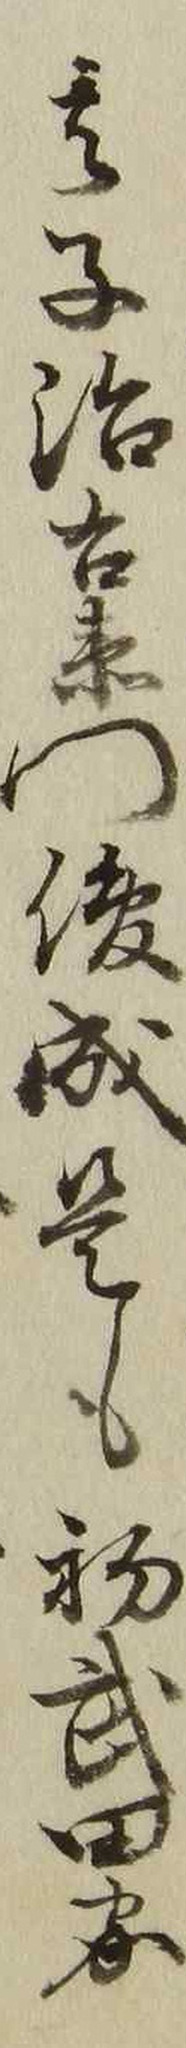其子治右衛門俊成是も初武田家
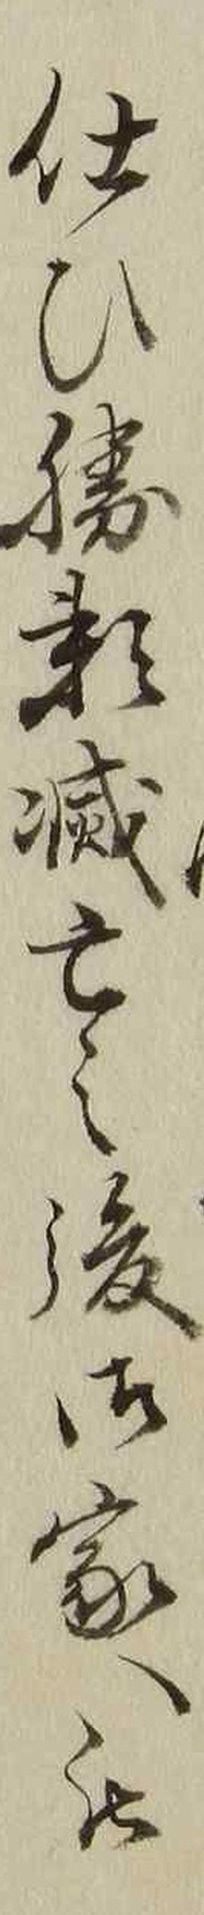仕ひ勝頼滅亡之後御家へ被
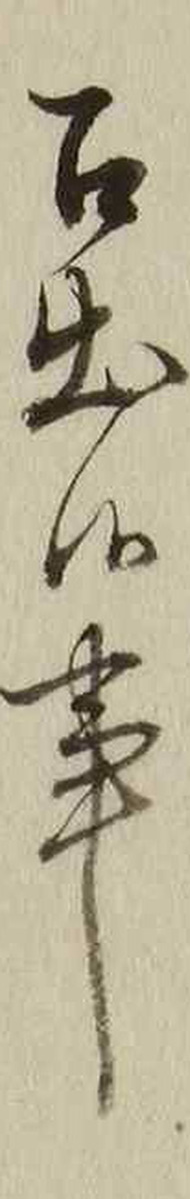召出候事
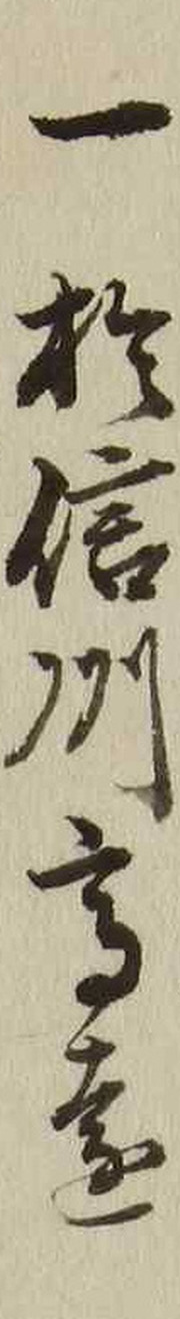一於信州高遠
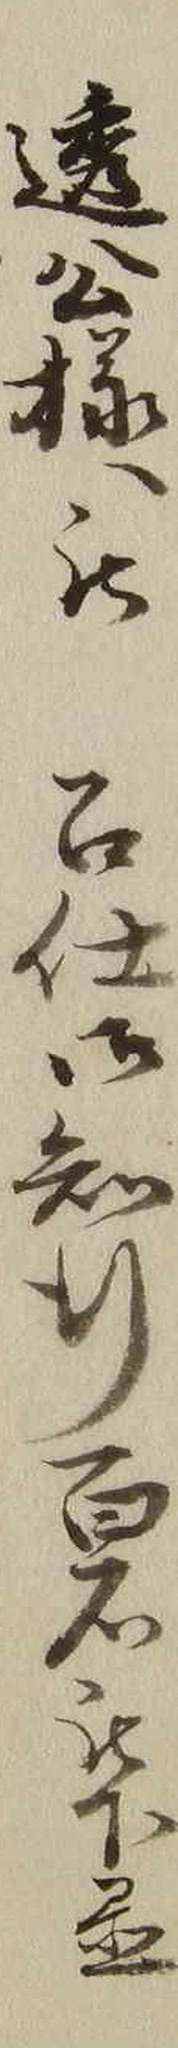透公様へ被召仕御知行百石被下置
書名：諸士系譜　巻之36　は之部4
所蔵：会津若松市立会津図書館
